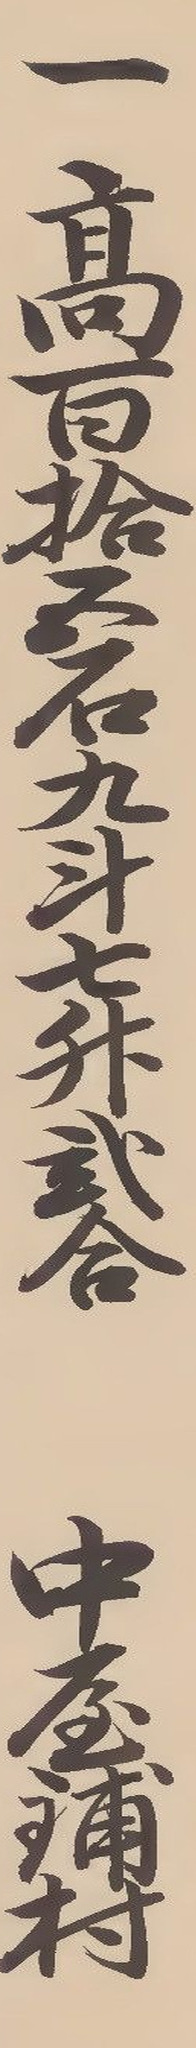一高百拾五石九斗七升弐合中屋舗村
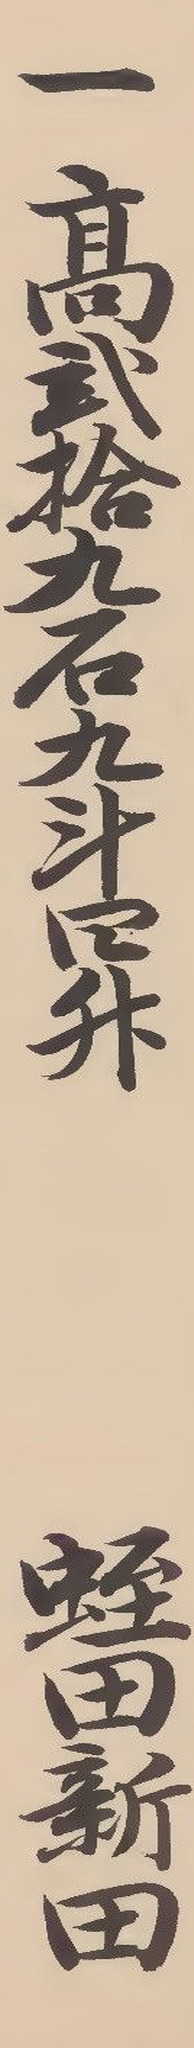一高弐拾九石九斗四升蛭田新田
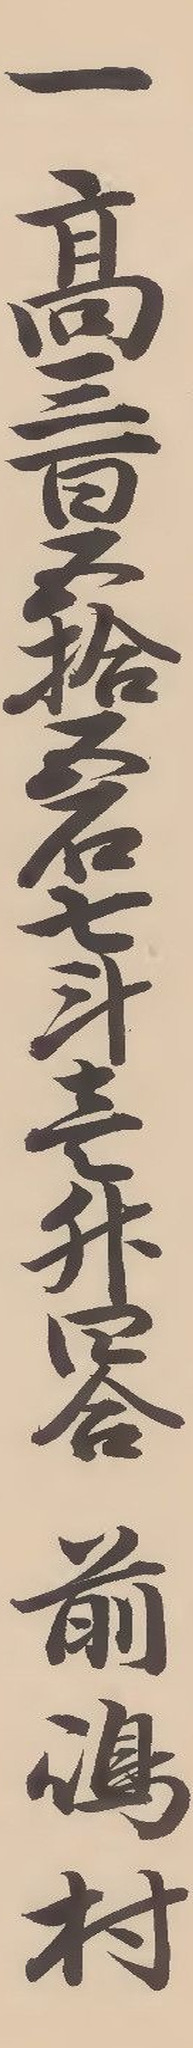一高三百五拾五石七斗壱升四合前島村
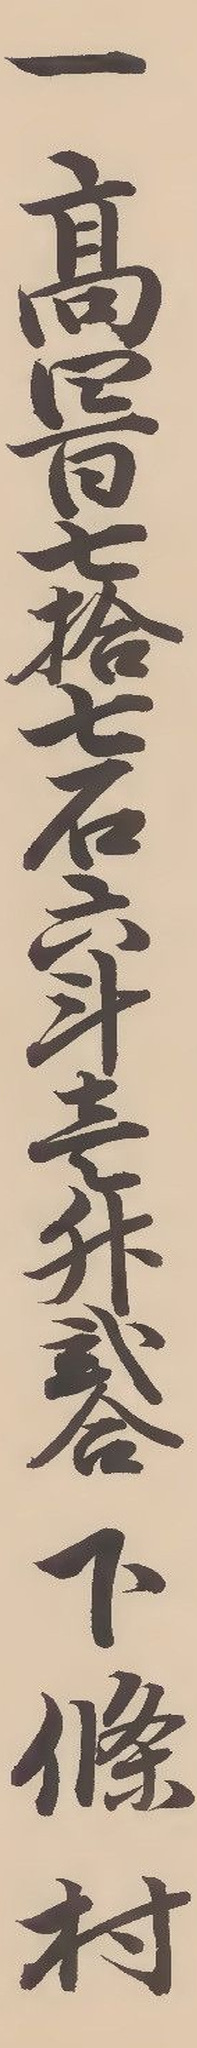一高四百七拾七石六斗壱升弐合下条村
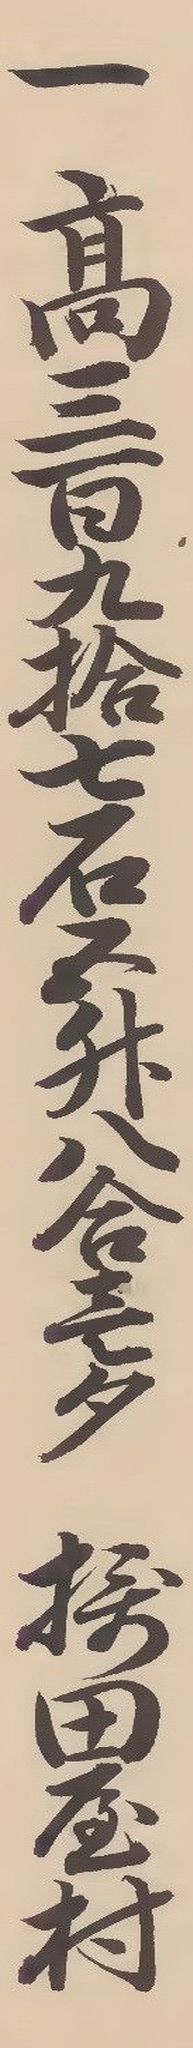一高三百九拾七石五升八合壱勺摂田屋村

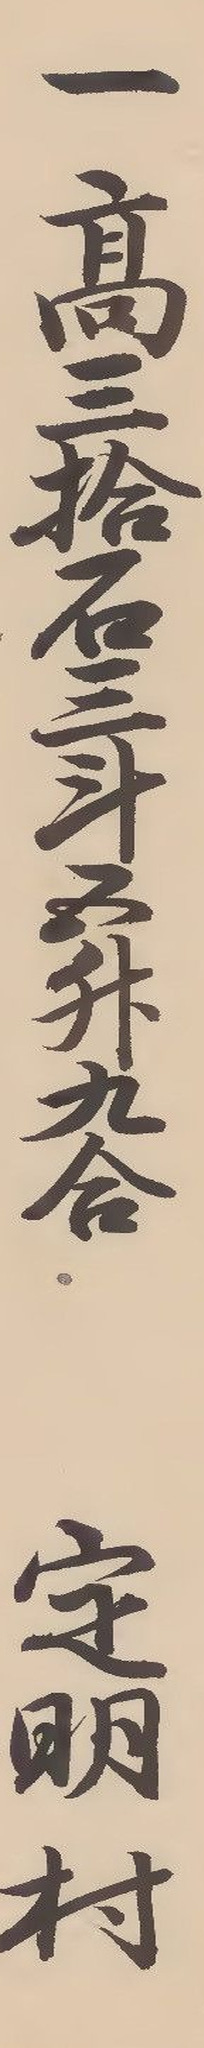一高三拾石三斗五升九合定明村
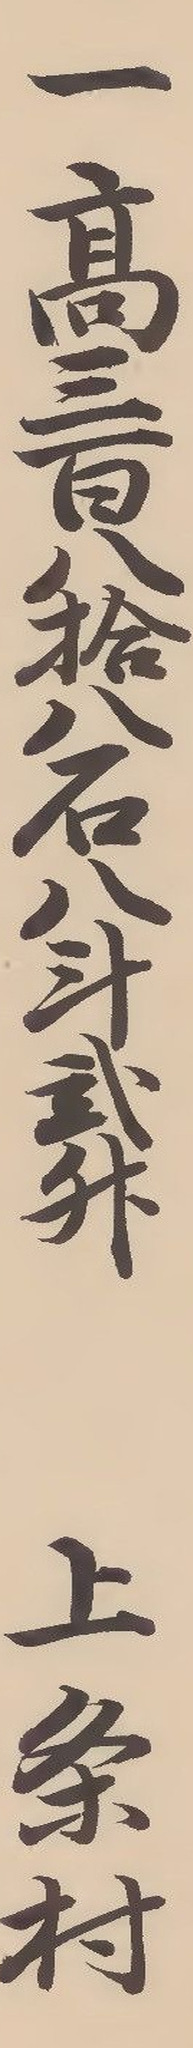一高三百八拾八石八斗弐升上条村
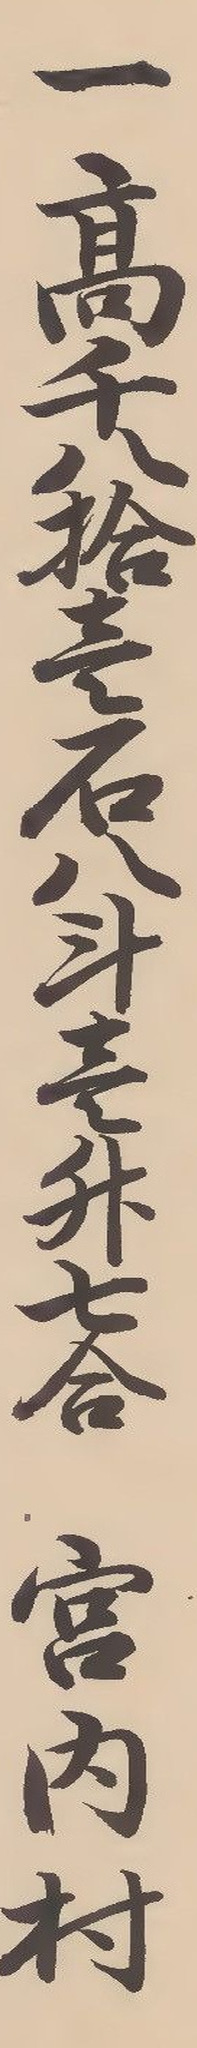一高千八拾壱石八斗壱升七合宮内村
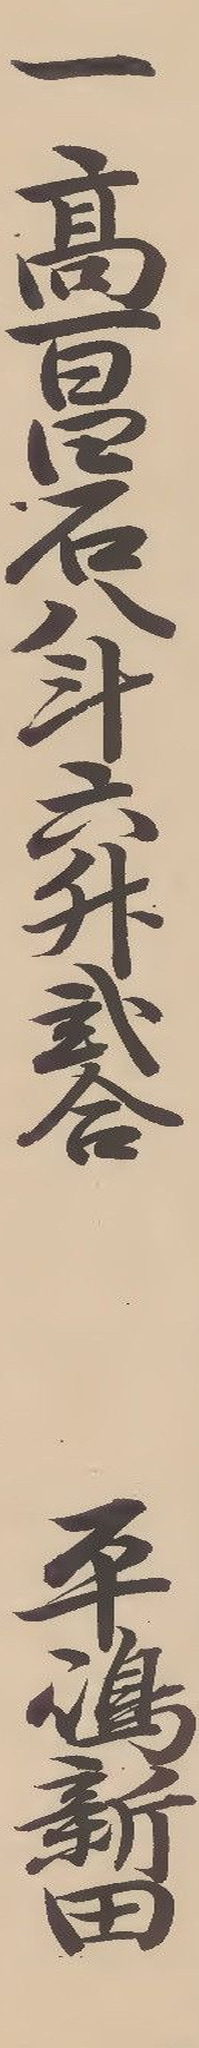一高百四石八斗六升弐合平島新田
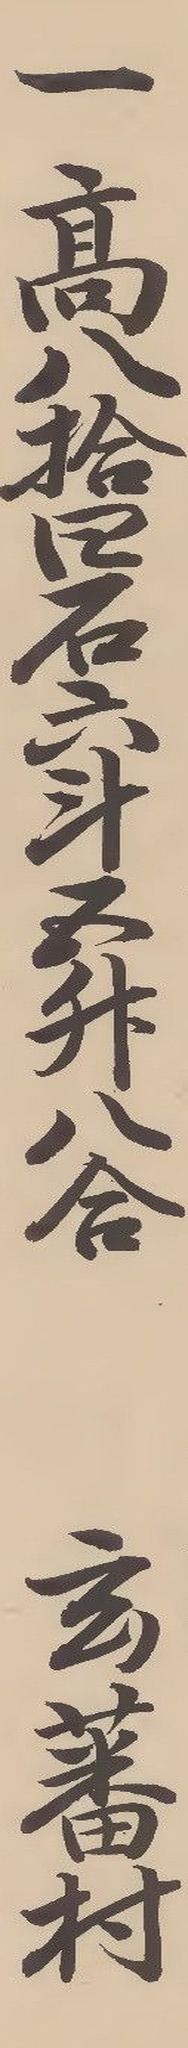一高八拾四石六斗五升八合玄蕃村
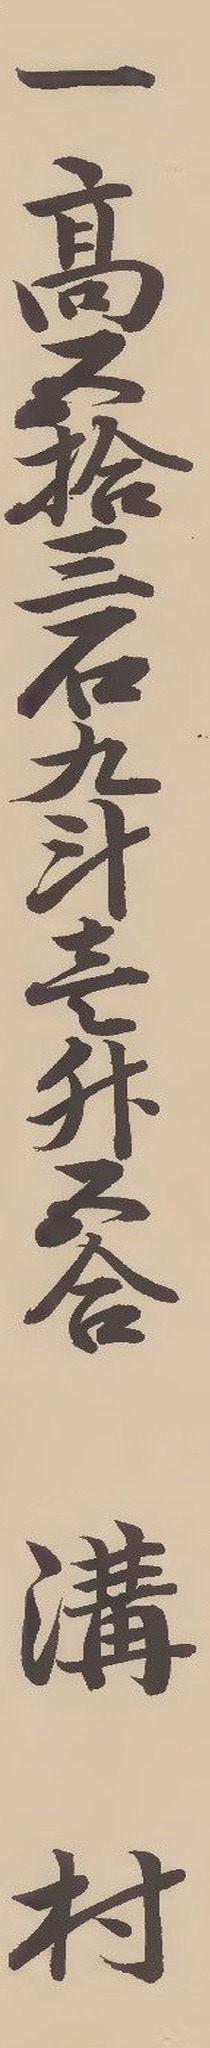一高五拾三石九斗壱升五合溝村
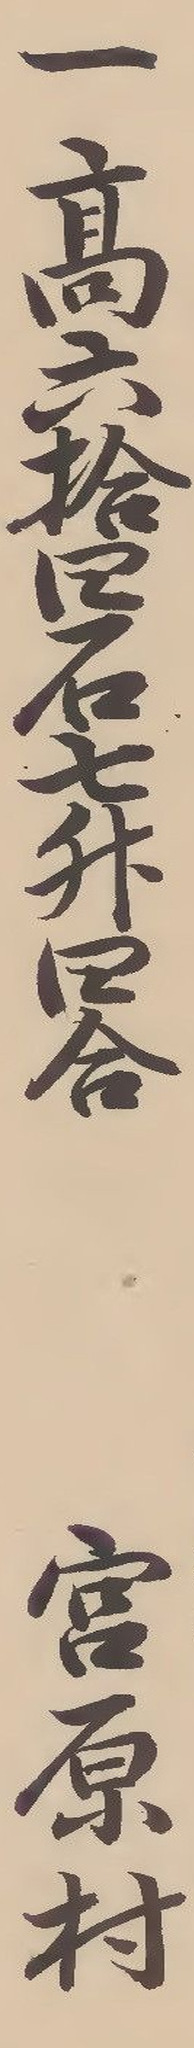一高六拾四石七升四合宮原村

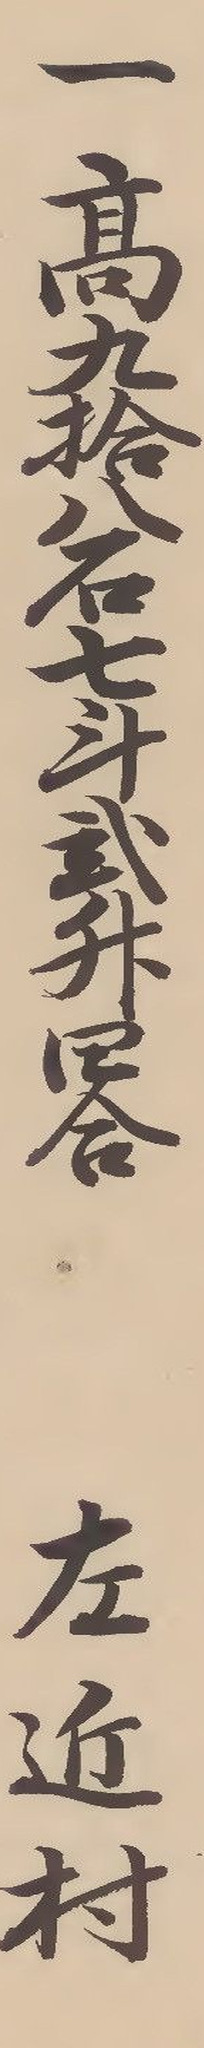一高九拾八石七斗弐升四合左近村
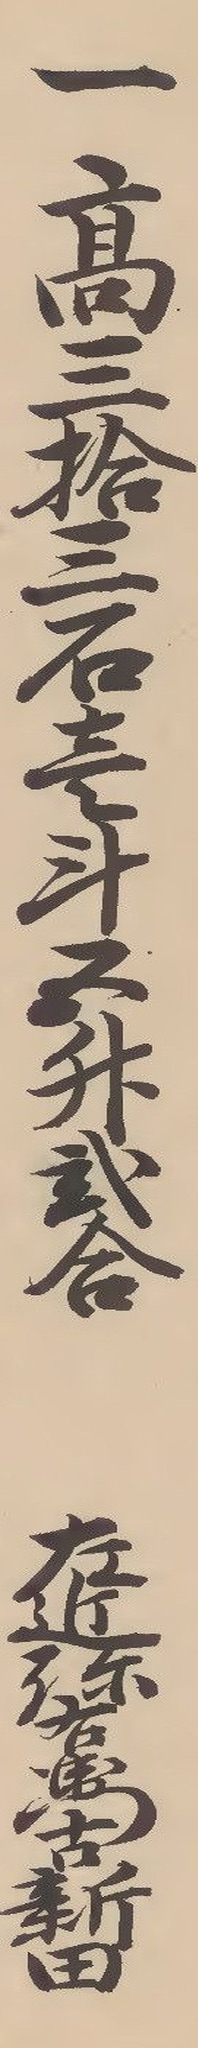一高三拾三石壱斗五升弐合左近弥右衛門古新田
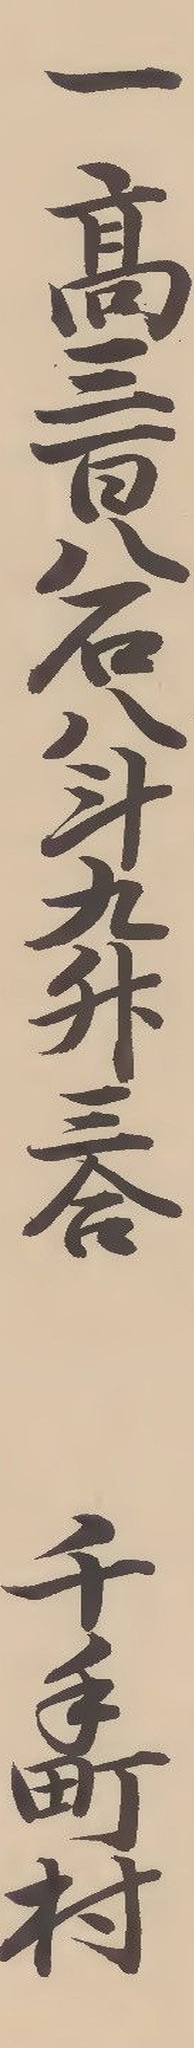一高三百八石八斗九升三合千手町村
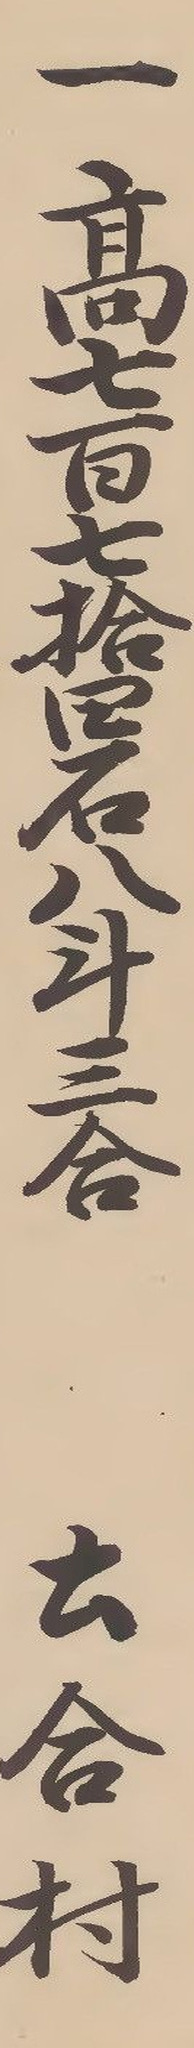一高七百七拾四石八斗三合土合村
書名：越後国郷帳　中
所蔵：国立公文書館 National Archives of Japan
